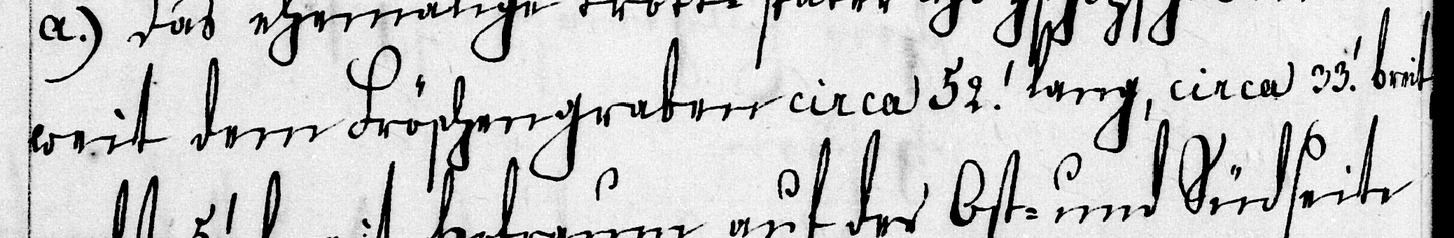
weit dem Fröschengraben circa 52’. lang, circa 33’. breit
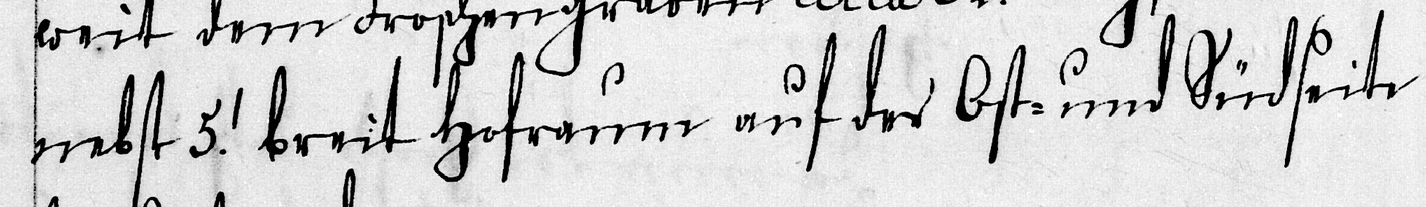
nebst 5’. breit Hofraum auf der Ost- und Südseite
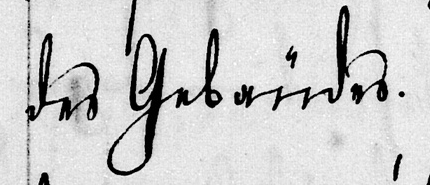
des Gebäudes.
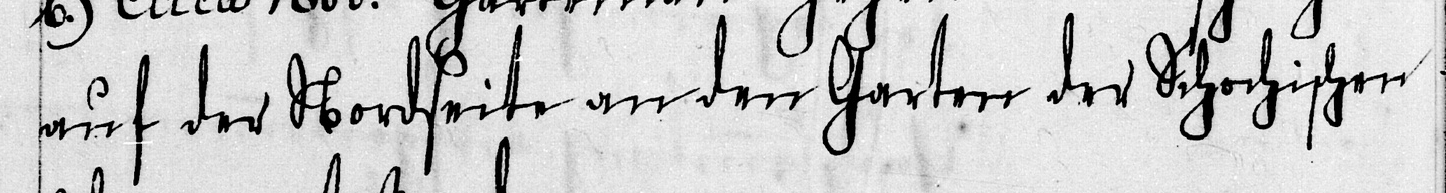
auf der Nordseite an den Garten der Schochischen
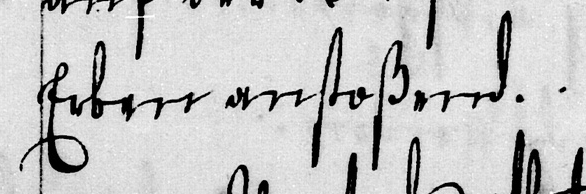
Erben anstoßend.
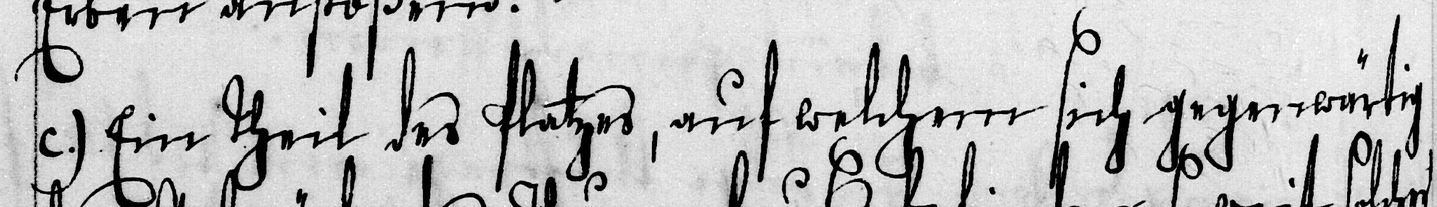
c.) Ein Theil des Platzes, auf welchem sich gegenwärtig
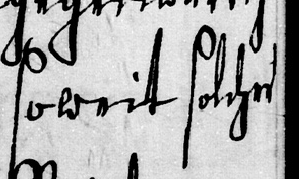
weit solch¬
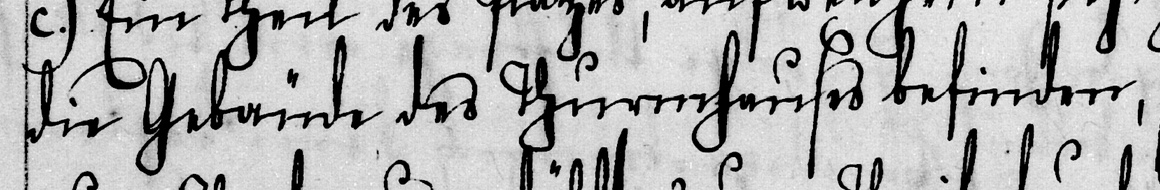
die Gebäude des Thurmhauses befinden,
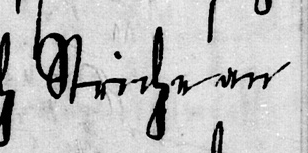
Striche an
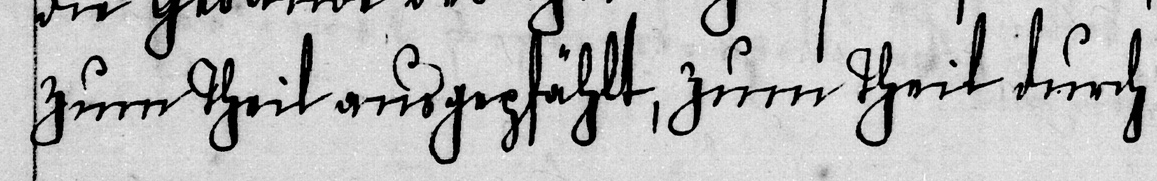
zum Theil ausgepfählt, zum Theil durch
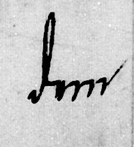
dem
